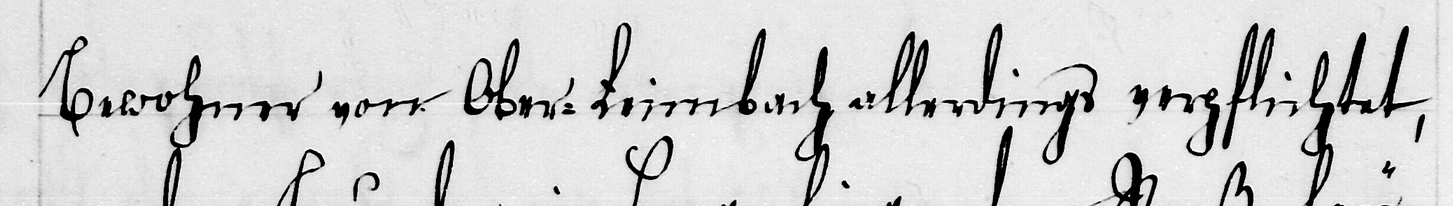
Bewohner von Ober-Leimbach allerdings verpflichtet,
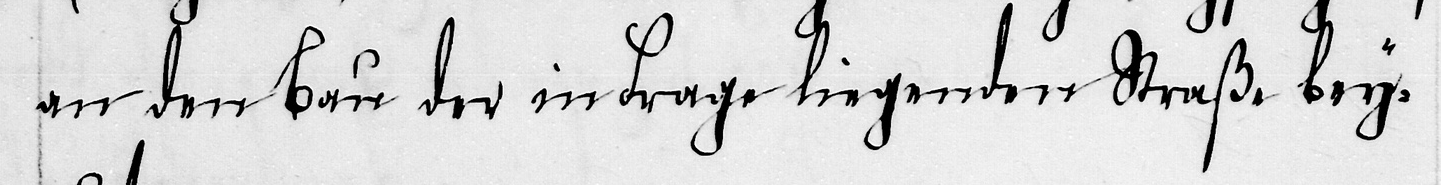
an den Bau der in Frage liegenden Straße bey¬
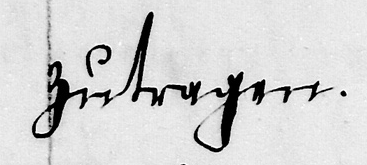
zutragen.
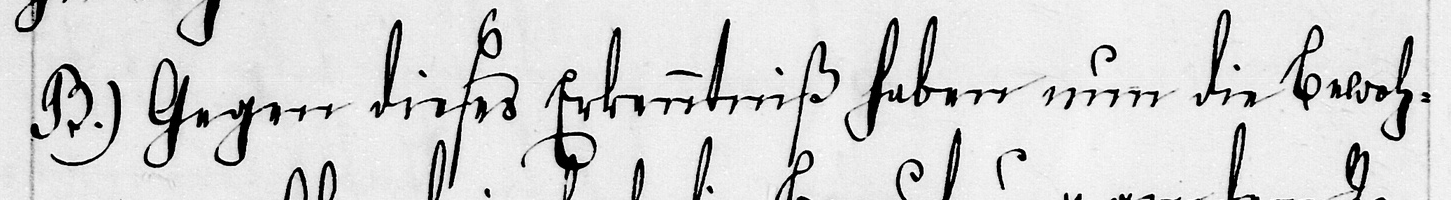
B.) Gegen dieses Erkenntniß haben nun die Bewoh¬
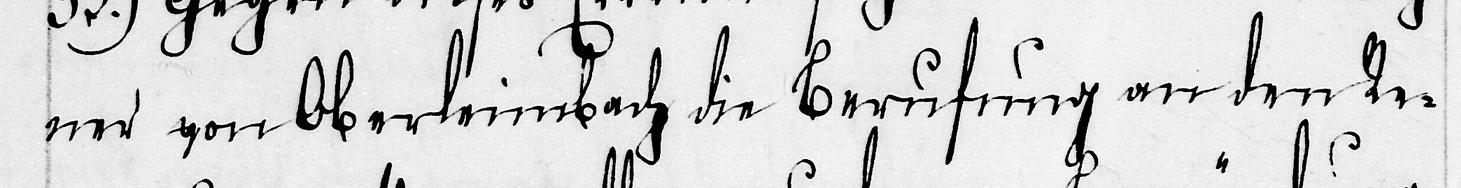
ner von Oberleimbach die Berufung an den Re¬
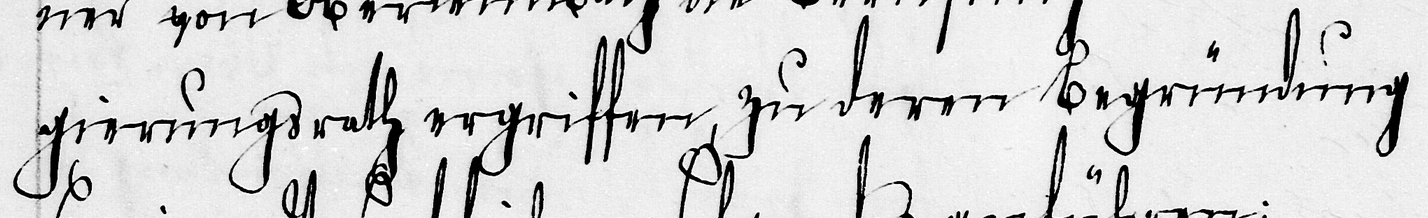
gierungsrath ergriffen, zu deren Begründung
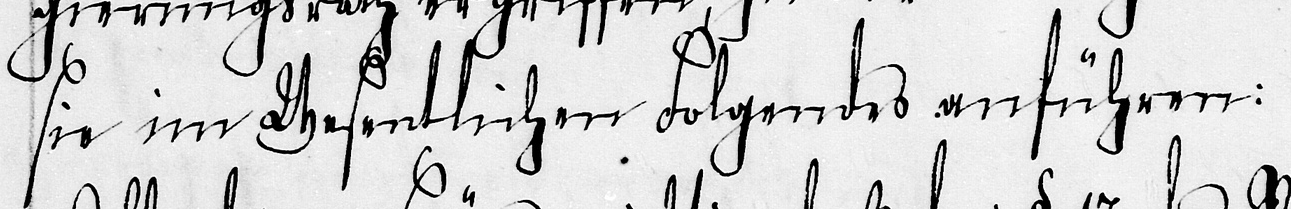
sie im Wesentlichen Folgendes anführen:
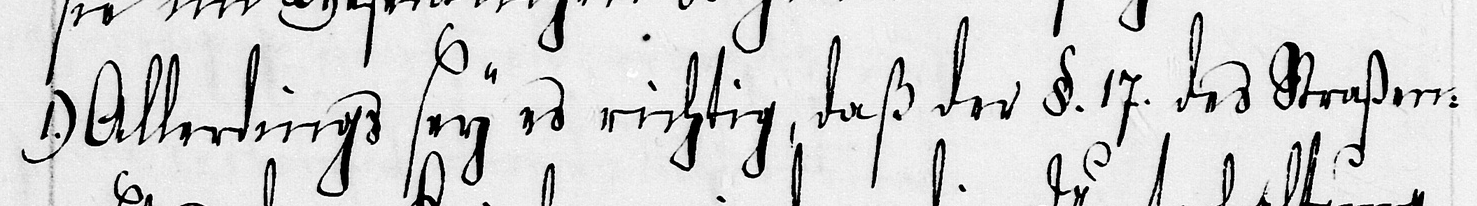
1.) Allerdings sey es richtig, daß der §. 17. des Straßen¬
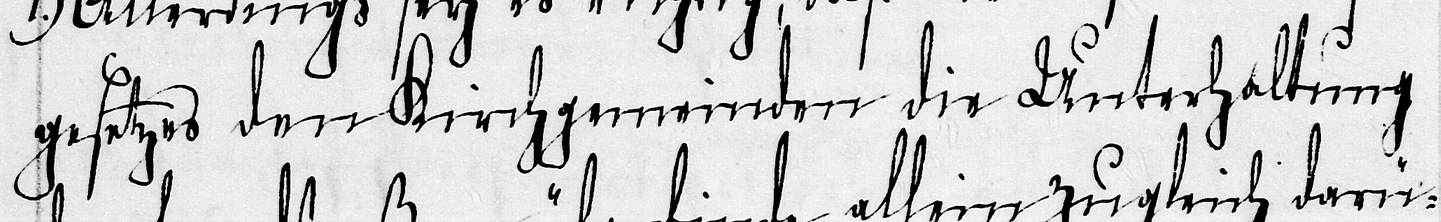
gesetzes den Kirchgemeinden die Unterhaltung
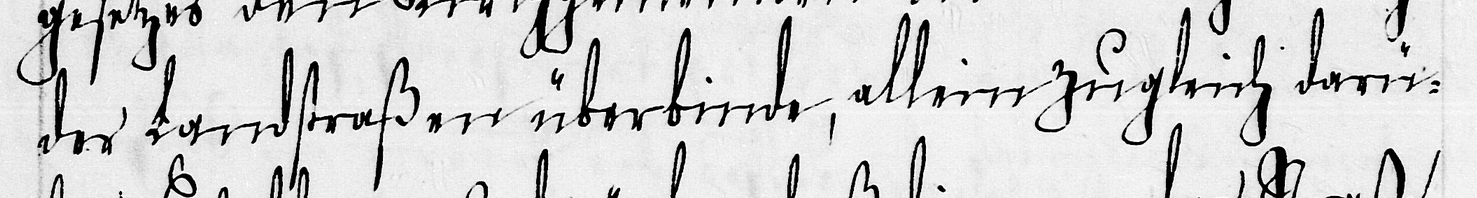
der Landstraßen überbinde, allein zugleich darü¬
